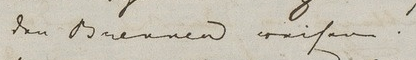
den Brenner reisen.
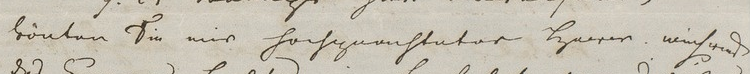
könten Sie mir hochgeachteter Herr – während
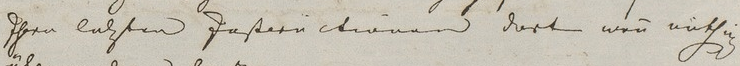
Ihre letzten Instructionen dort wenn nöthig
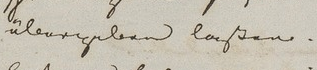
übergeben laßen. –
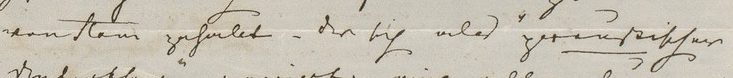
von Stamm gehabt – der sich als «preußischer
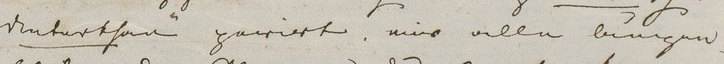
Unterthan» gerirt – mir alle Augen-
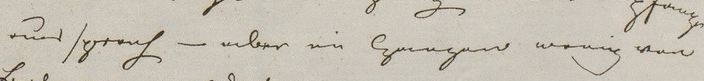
aussprach – aber im Ganzen wenig von
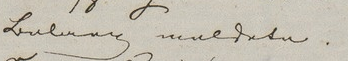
Belang meldete.
